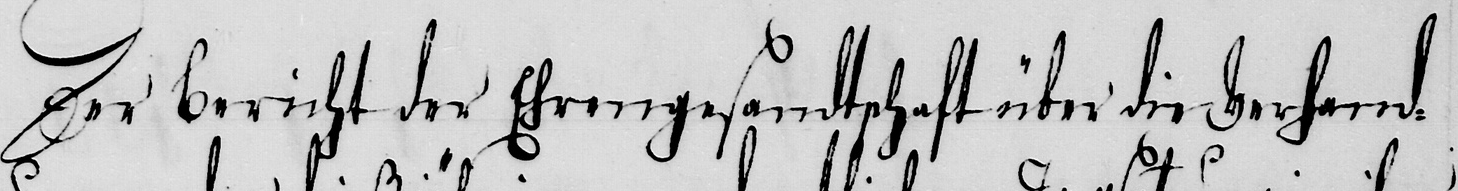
Der Bericht der Ehrengesandtschaft über die Verhand¬
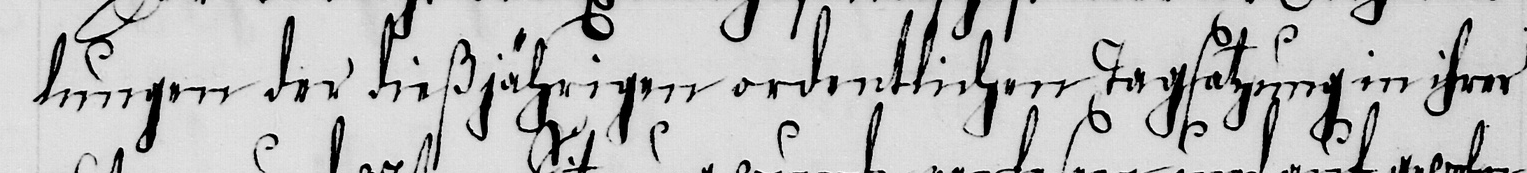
lungen der dießjährigen ordentlichen Tagsatzung in ihrer
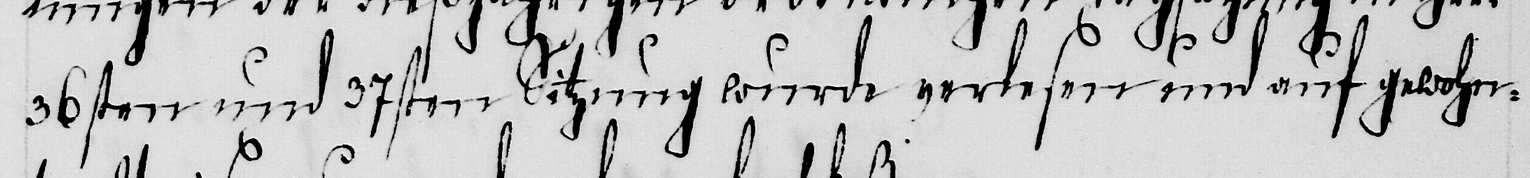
36sten und 37sten Sitzung wurde verlesen und auf gewohn¬
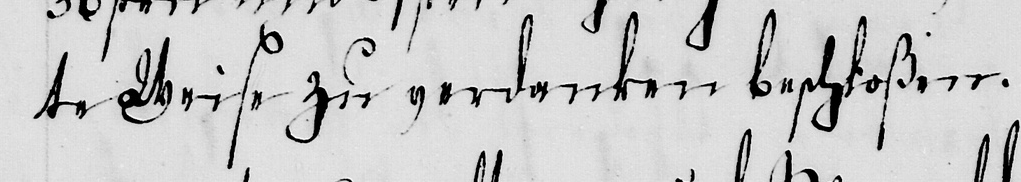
te Weise zu verdanken beschloßen.
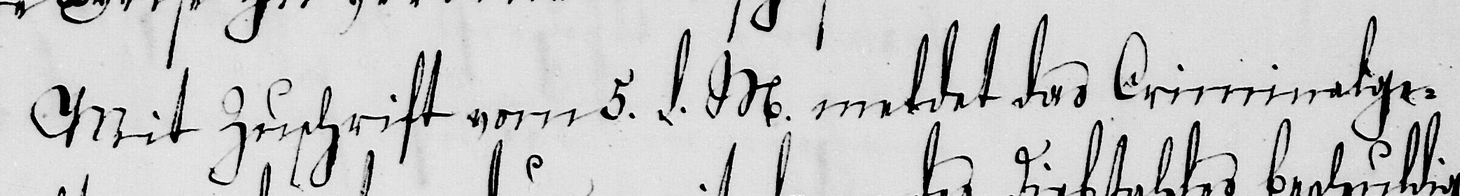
Mit Zuschrift vom 5. d. M. meldet das Criminalge¬
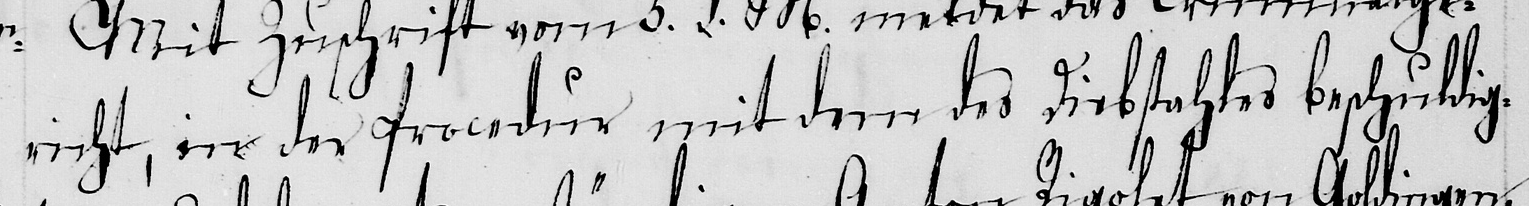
richt, in der Procedur mit dem des Diebstahles beschuldig¬
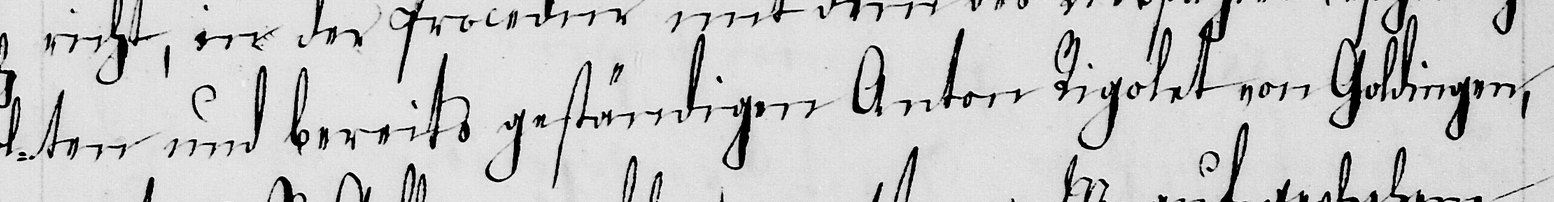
ten und bereits geständigen Anton Rigolet von Goldingen,
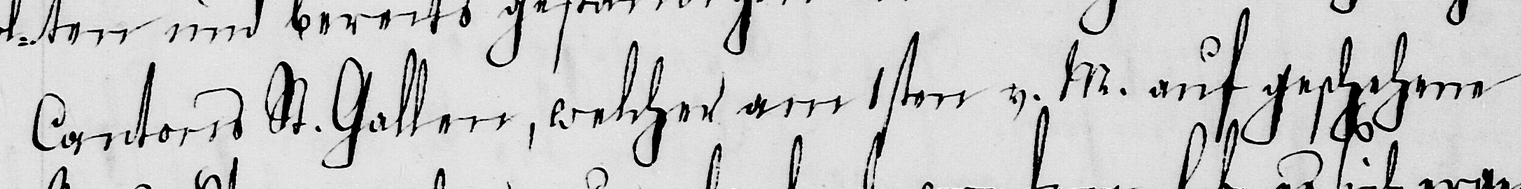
Cantons St. Gallen, welcher am 1sten v. M. auf geschehene
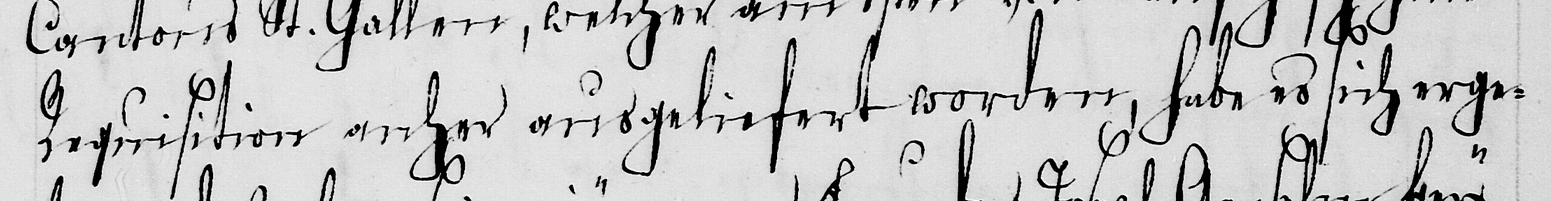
Requisition anher ausgeliefert worden, habe es sich erge¬
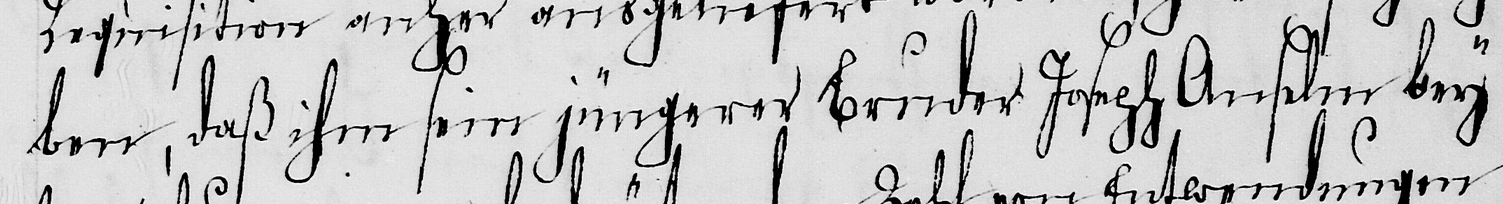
ben, daß ihm sein jüngerer Bruder Joseph Anselm bey
